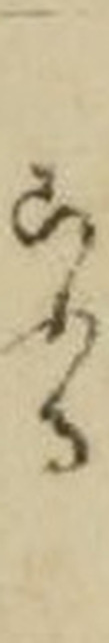こふる
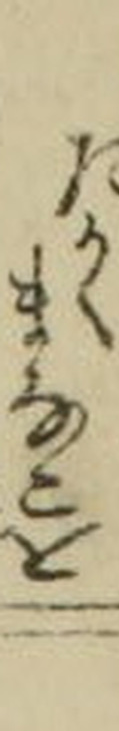たかくまなこを
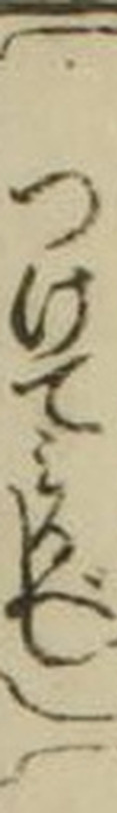つけてみるべし
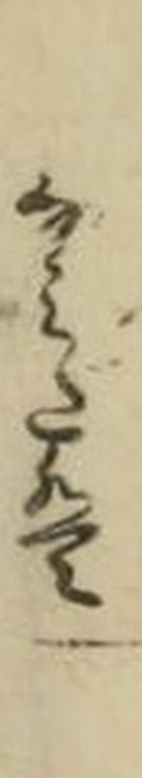なみだは
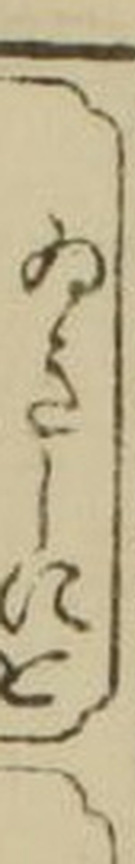ゐきしにを
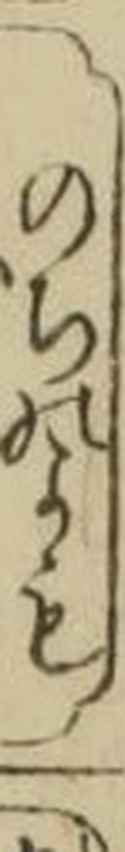のちのよも
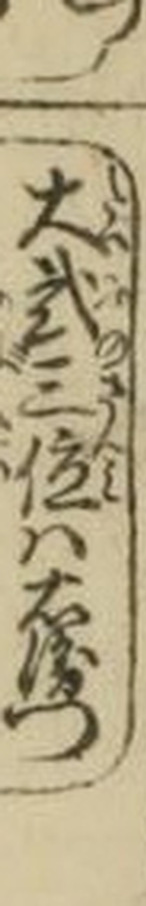大弐三位は右衛門
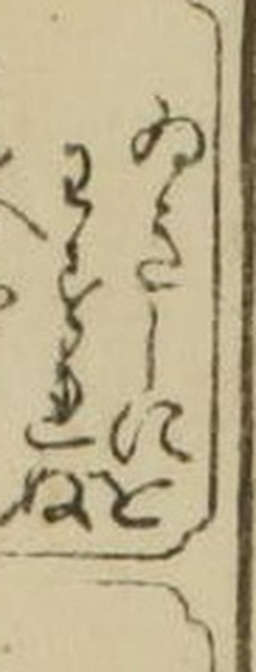わすれぬ
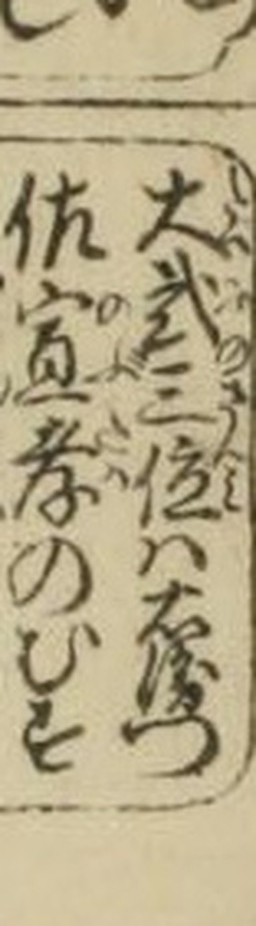佐宣孝のむす
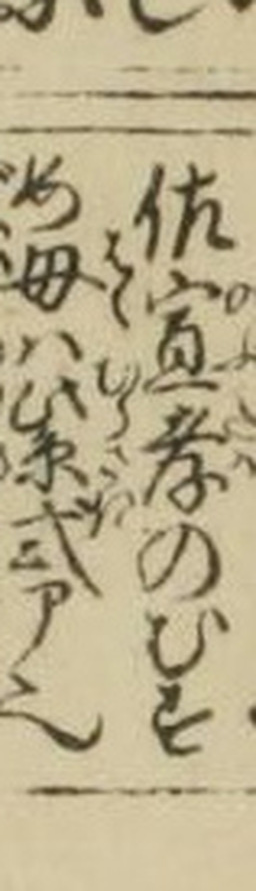め母は紫式部也
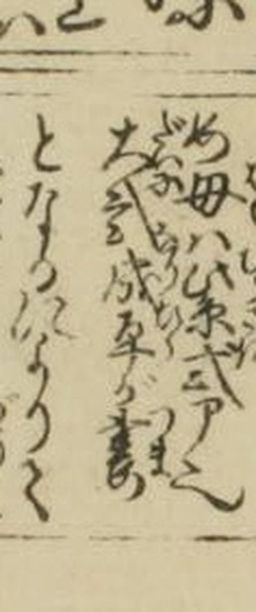大弐成平が妻
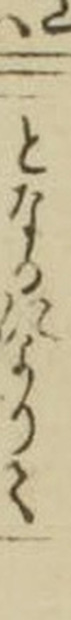となるによりて
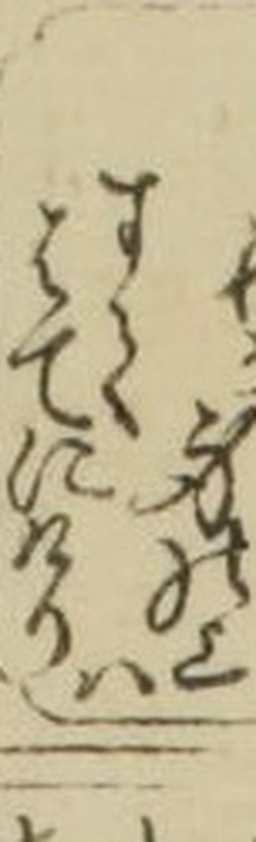はてにけり
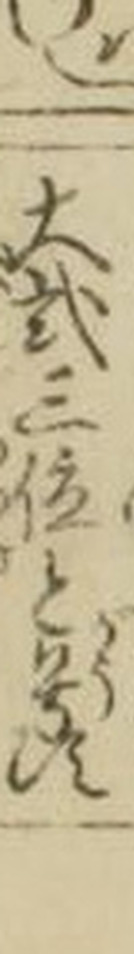大弐三位と号す
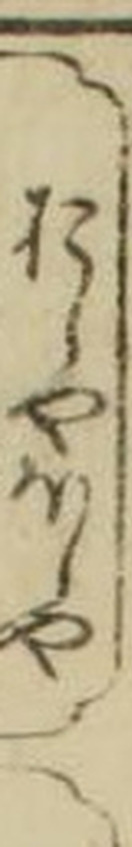おしやほしや
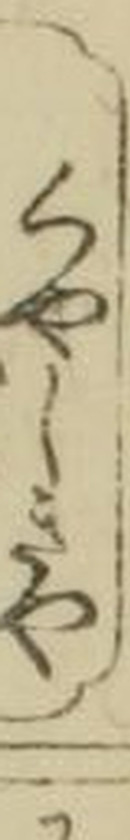くやしきや
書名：女源氏教訓鑑
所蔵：東京学芸大学附属図書館
